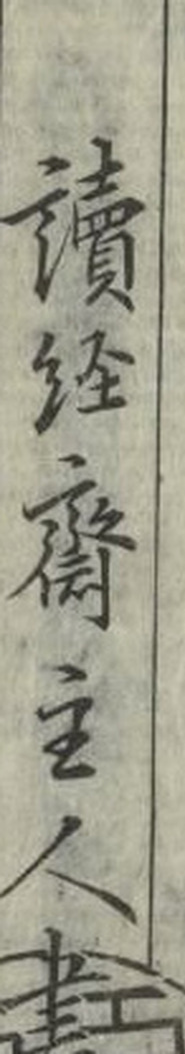読経斎主人書
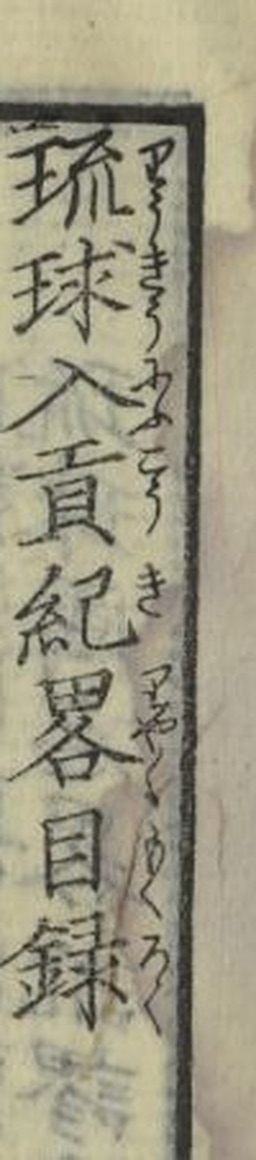琉球入貢紀略目録
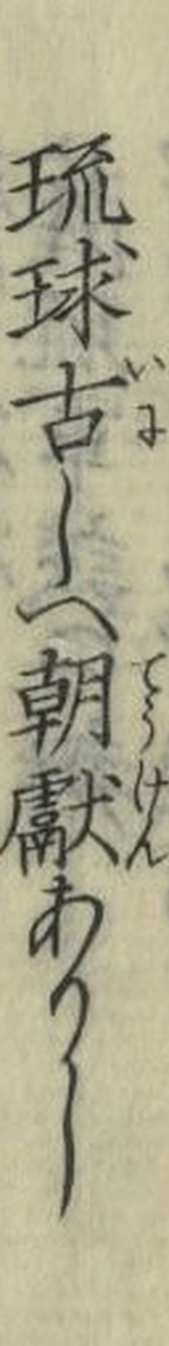琉球古しへ朝献ありし
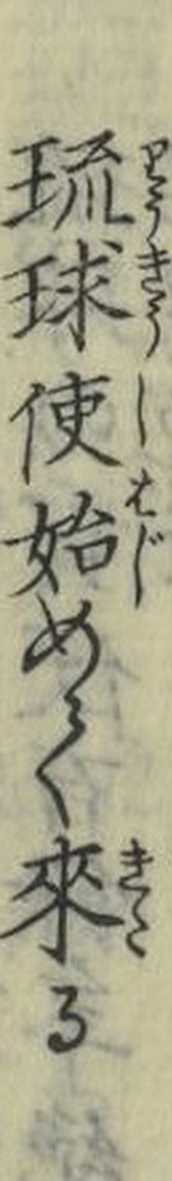琉球使始めて来る
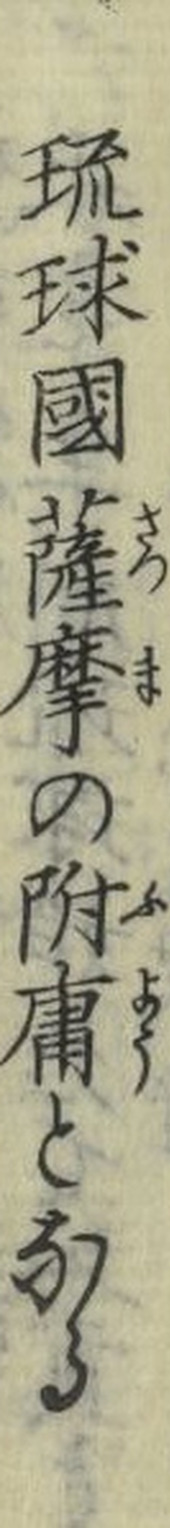琉球国薩摩の附庸となる
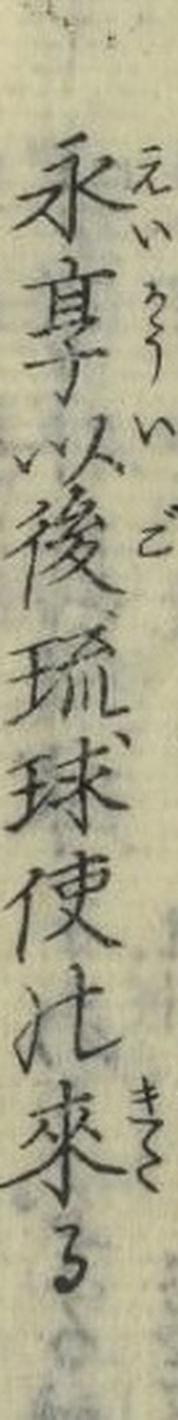永享以後琉球使の来る
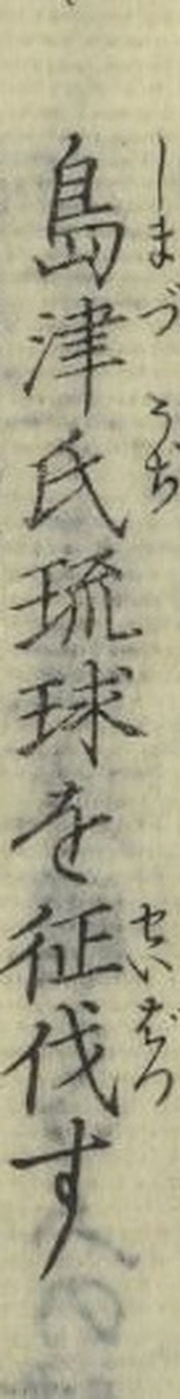島津氏琉球を征伐す
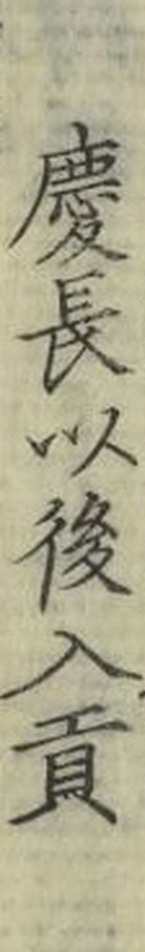慶長以後入貢
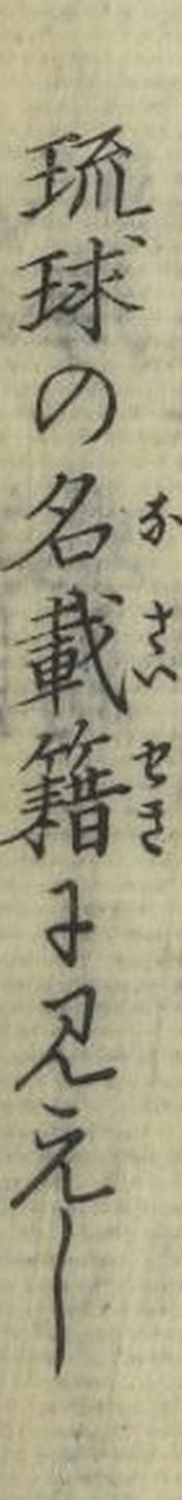琉球の名載籍に見えし

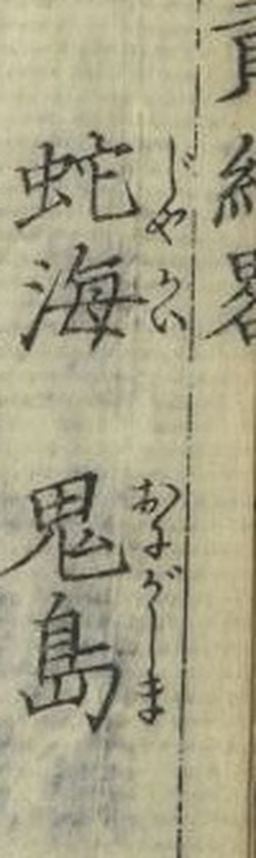蛇海鬼島
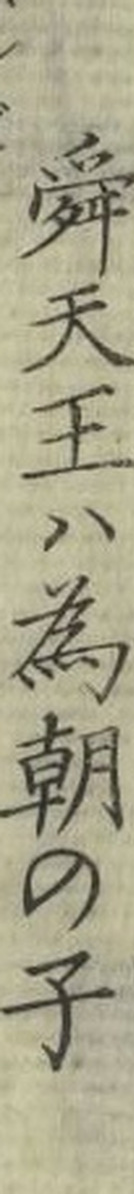舜天王は為朝の子
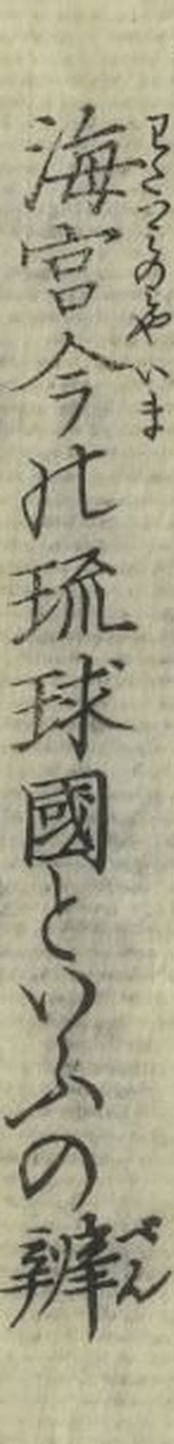海宮今の琉球国といふの弁
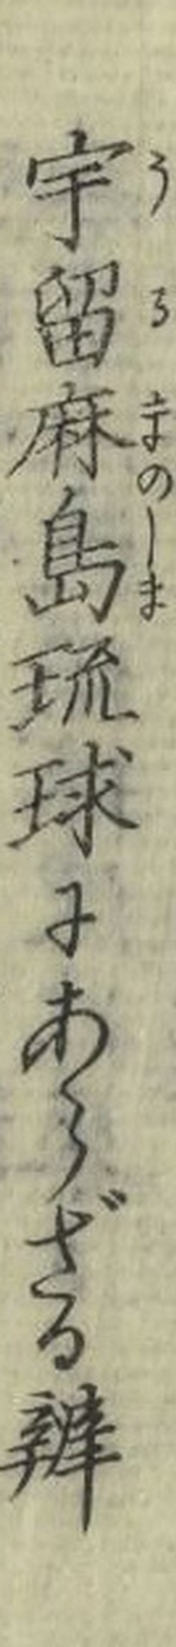宇留麻島琉球にあらざる弁
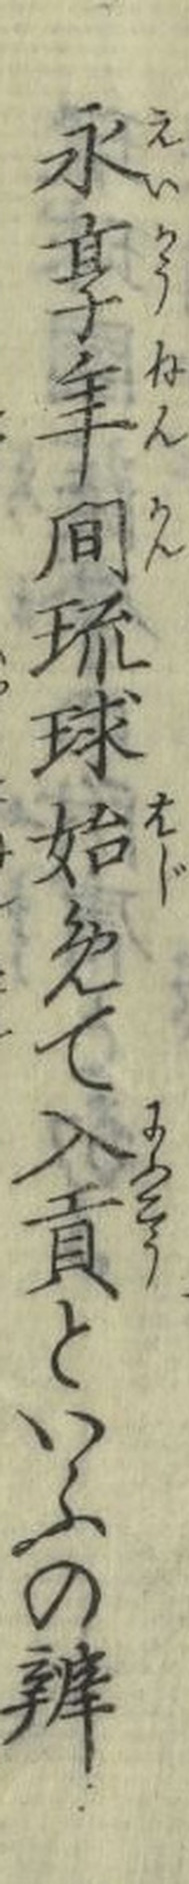永享年間琉球始めて入貢といふの弁
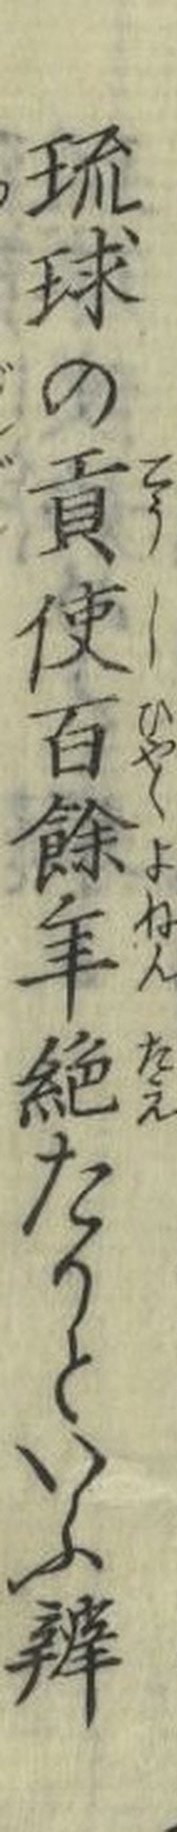琉球の貢使百余年絶たりといふ弁
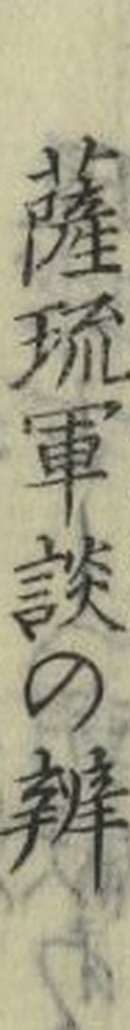薩琉軍談の弁
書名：琉球入貢紀畧
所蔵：University of the Ryukyus Library
